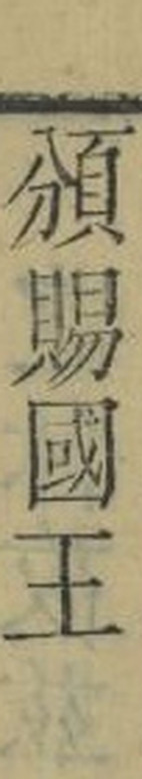領賜國王
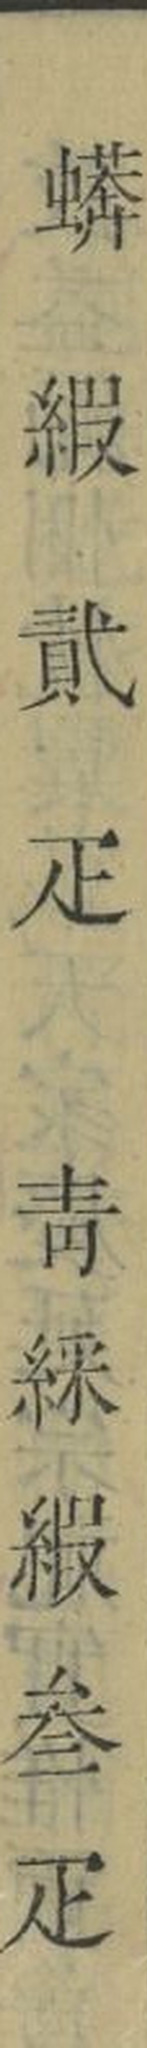蠎縀貮疋靑綵縀参疋
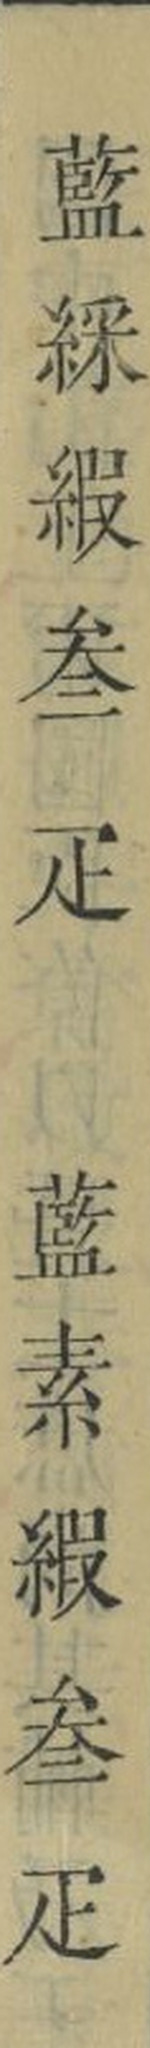藍綵縀参疋藍素縀参疋
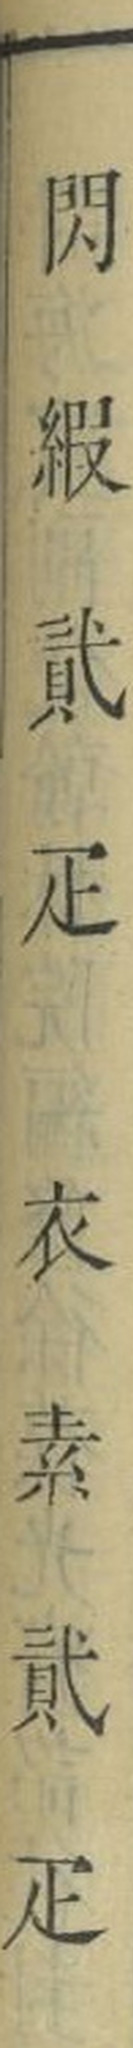閃縀貮疋衣素貮疋
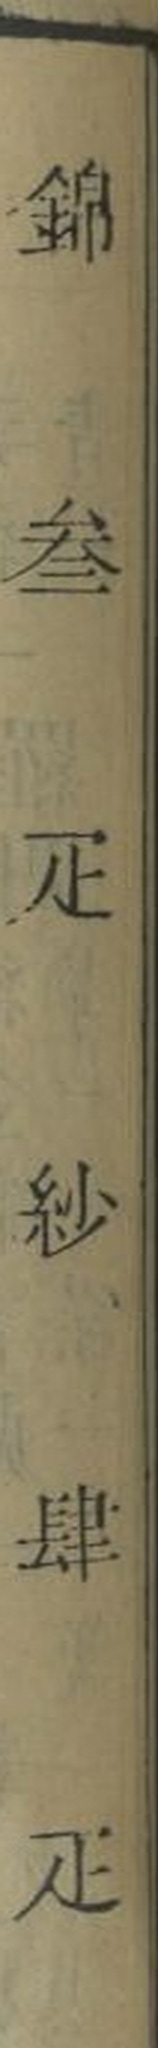錦参疋紗肆疋
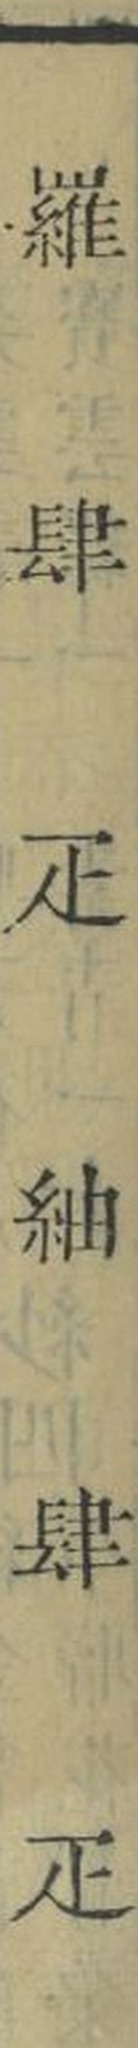羅肆疋紬肆疋
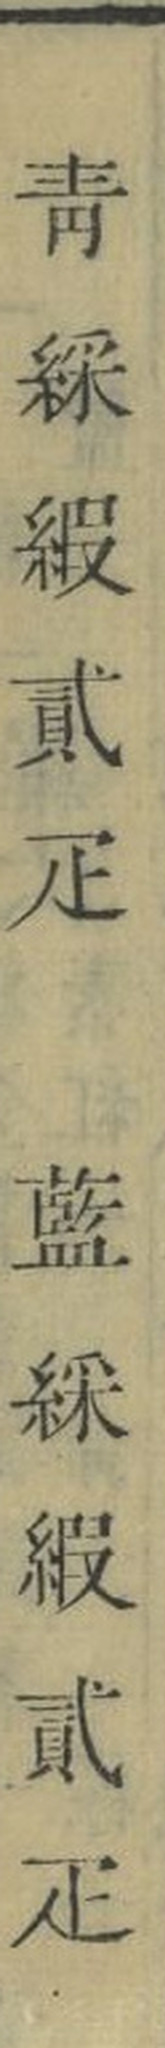靑綵縀貳疋藍綵縀貳疋
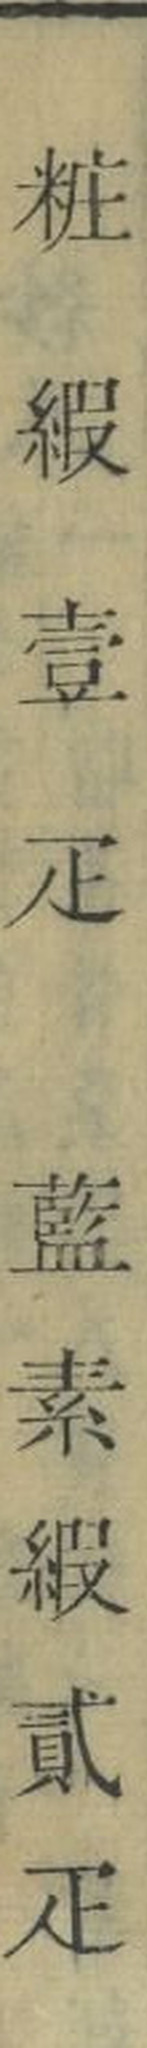粧縀壹疋藍素縀貳疋
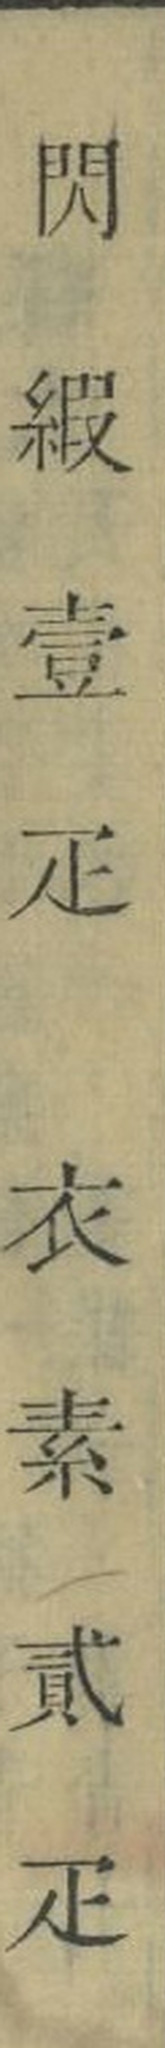閃縀壹疋衣素貳疋
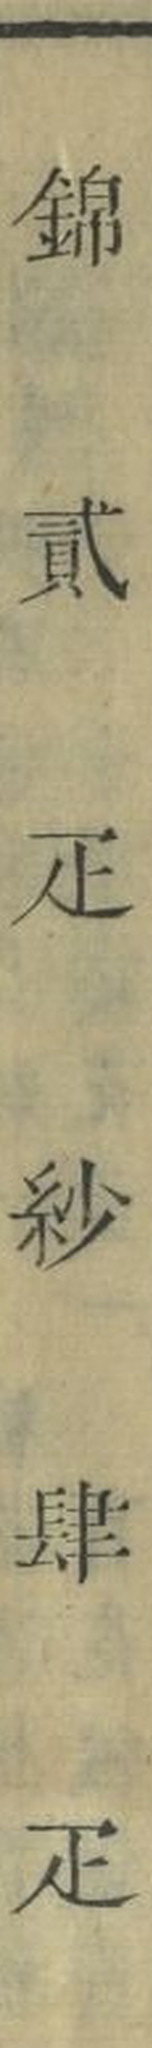錦貳疋紗肆疋
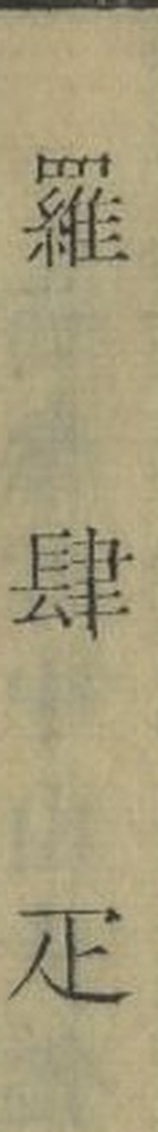羅肆疋
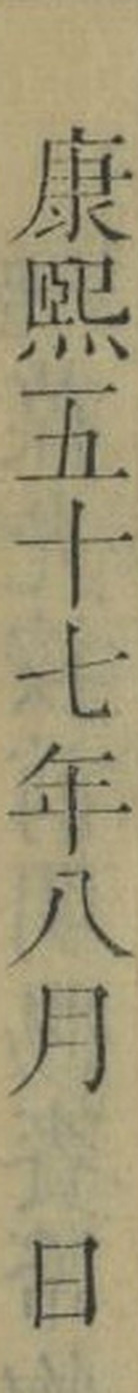康煕五十七年八月日

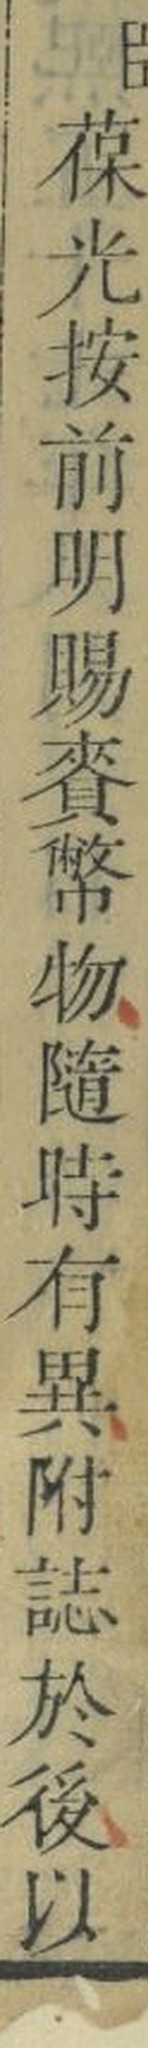臣葆光按前明賜賚幣物隨時有異附誌於後以
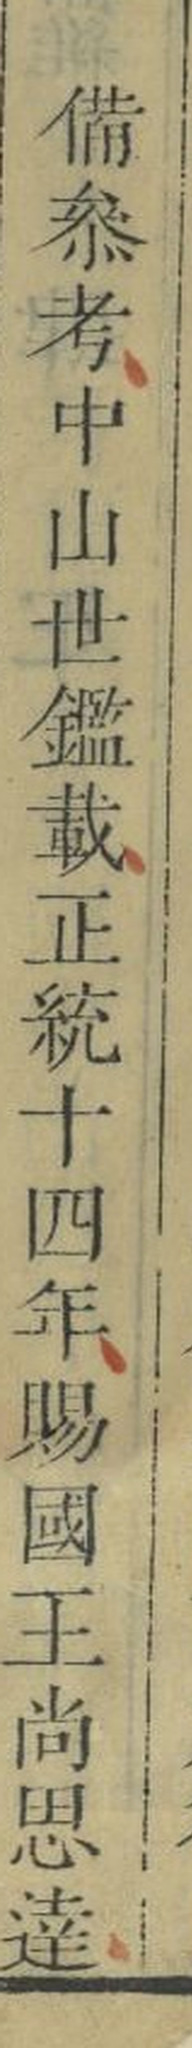備叅考中山世鑑載正統十四年賜國王尚思逹
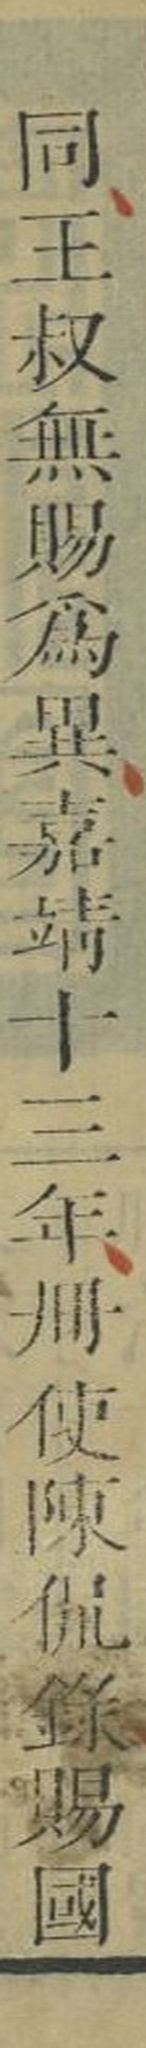同王叔無賜爲異嘉靖十三年册使陳侃錄賜國
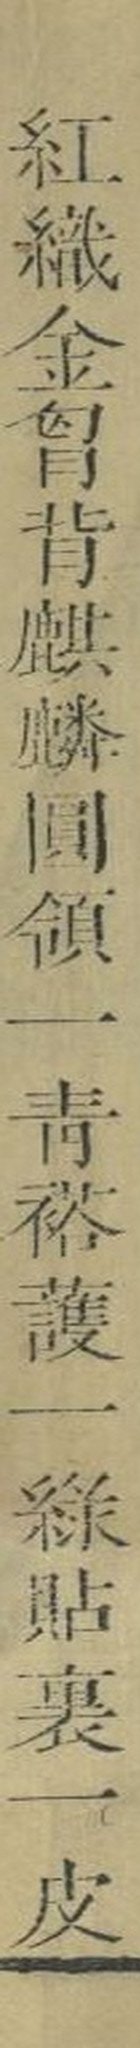紅織金胷背麒麟圓領一靑褡護一綠貼裏一皮
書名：中山伝信録 巻一、巻二
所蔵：University of the Ryukyus Library
